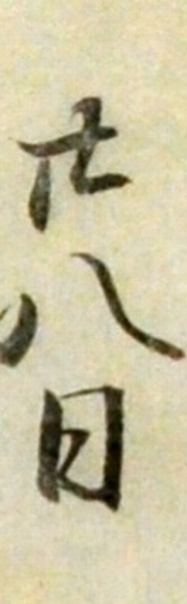廿八日
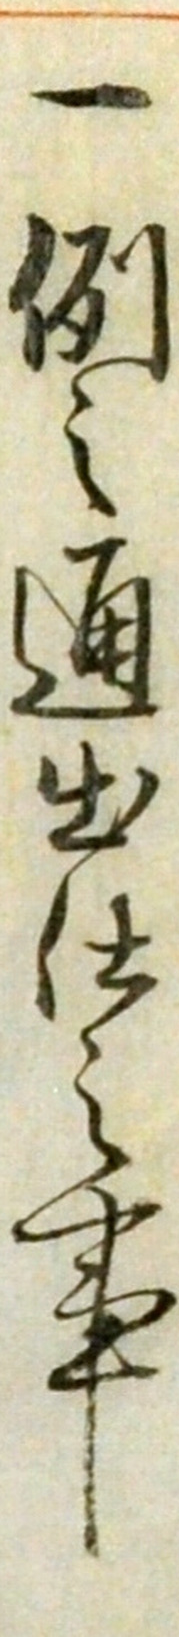一例之通出仕之事

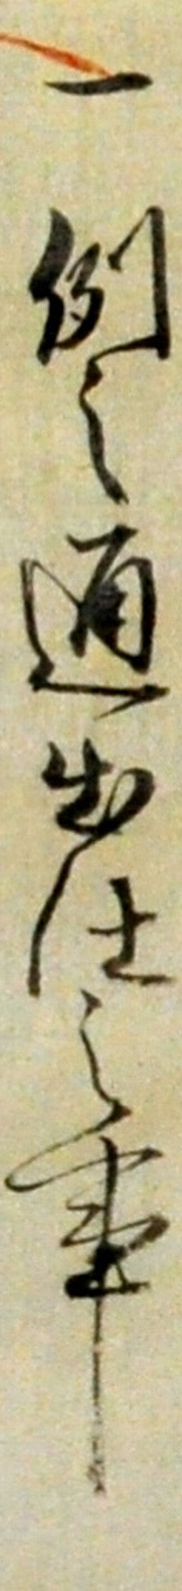一例之通出仕之事
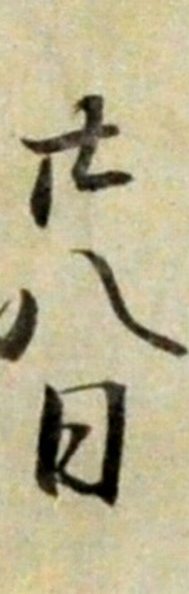廿八日
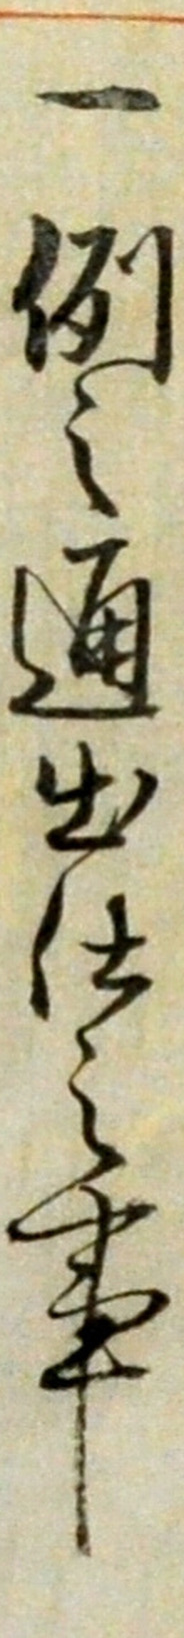一例之通出仕之事
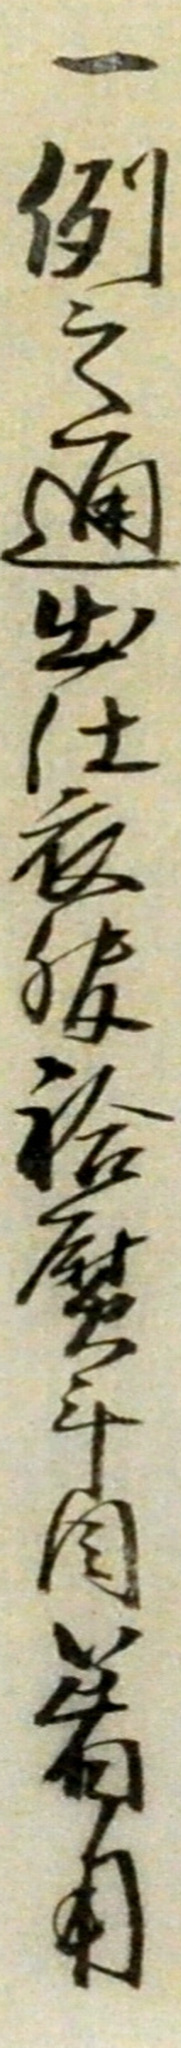一例之通出仕衣服袷熨斗目着用
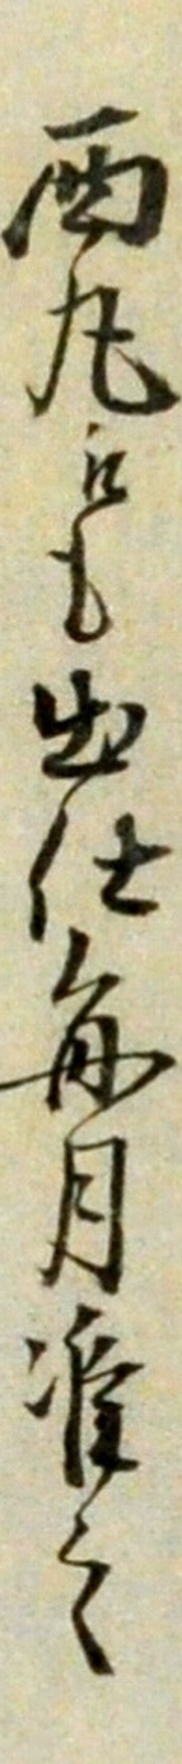西丸えも出仕毎月准之
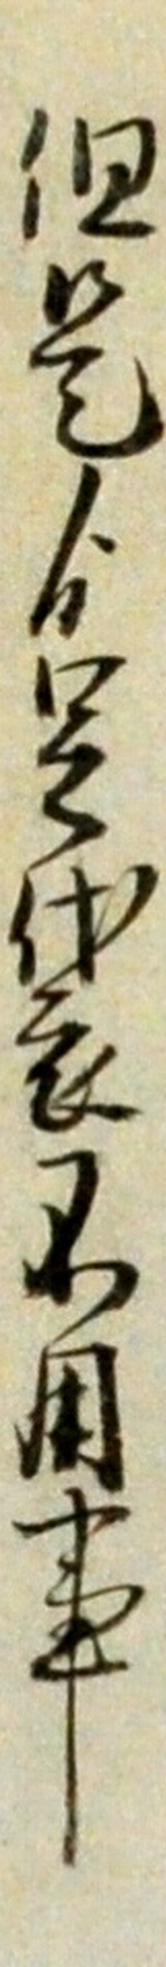但是ゟ足袋不用事
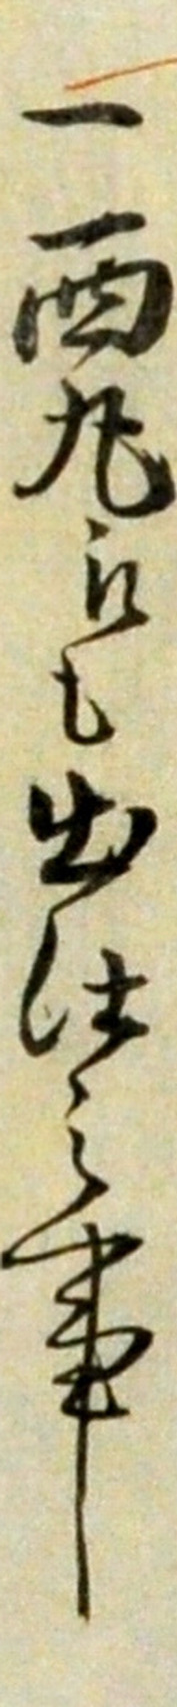一西丸えも出仕之事
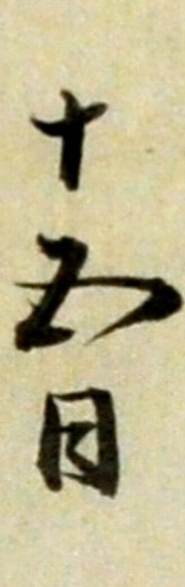十五日
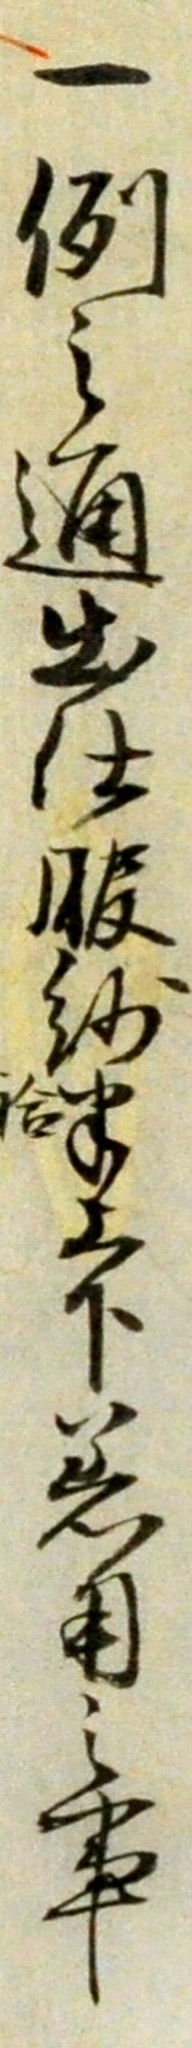一例之通出仕服紗袷半上下着用之事
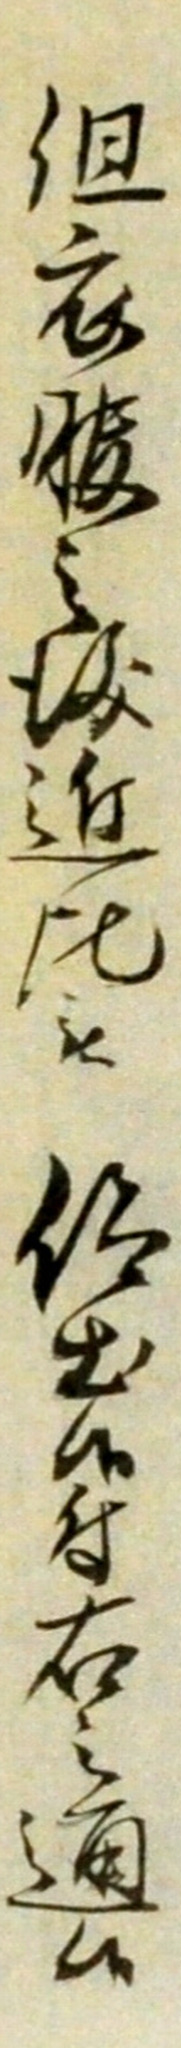但衣服之儀近比被仰出候付右之通候
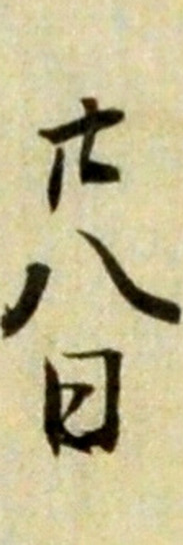廿八日
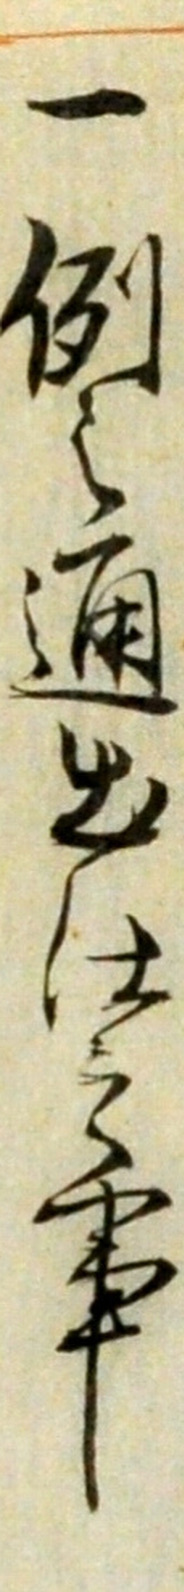一例之通出仕之事
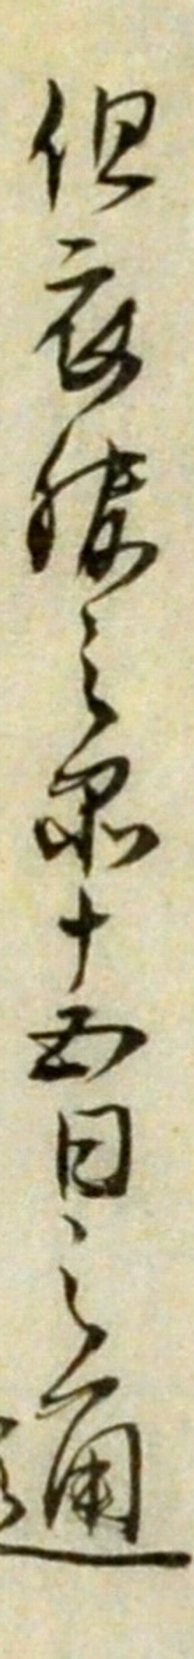但衣服之品十五日之通
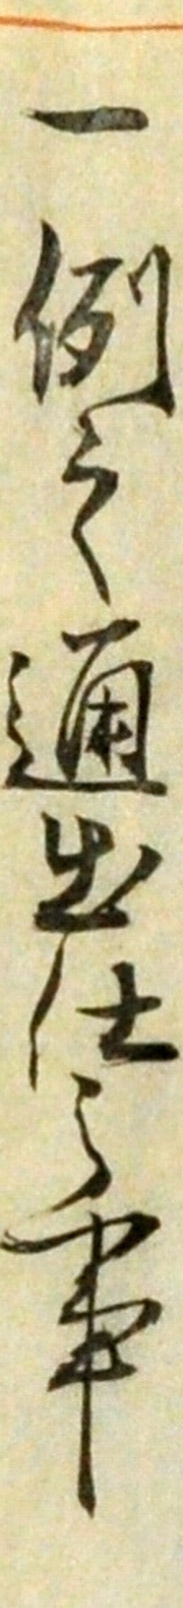一例之通出仕之事
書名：申合帳〔一括〕
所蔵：伊那市立高遠町図書館・合同会社AMANE
